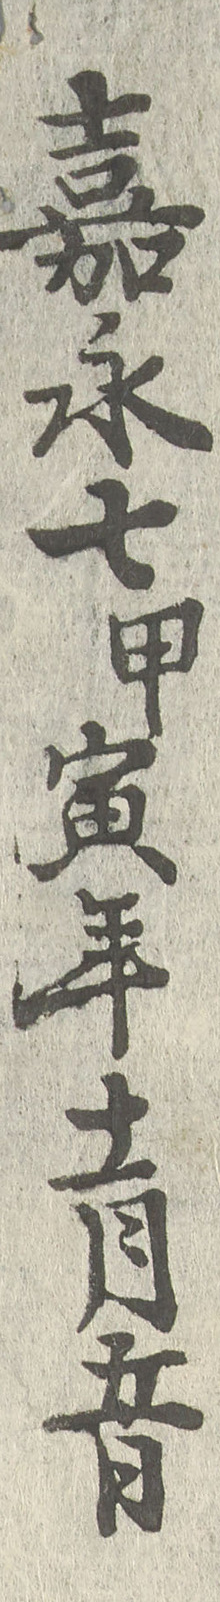嘉永七甲寅年十一月五日
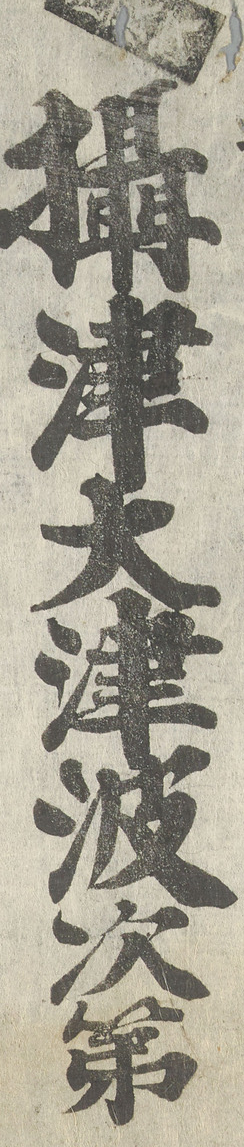摂津大津波次第
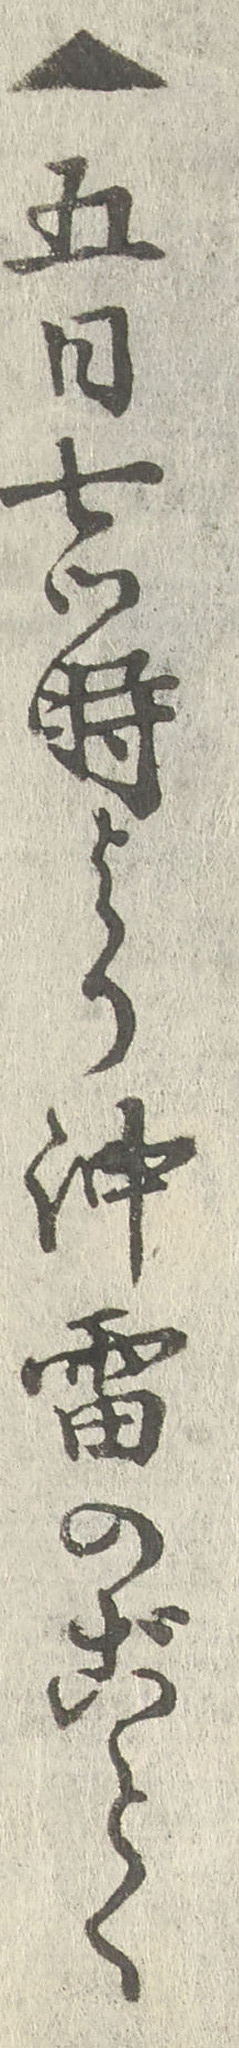▲五日七ッ時より沖雷のごとく
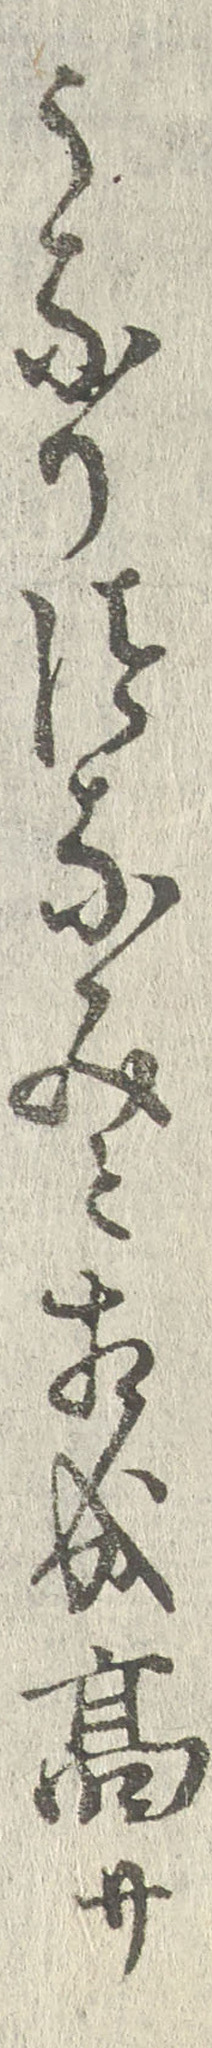うなりつなみと相成高さ
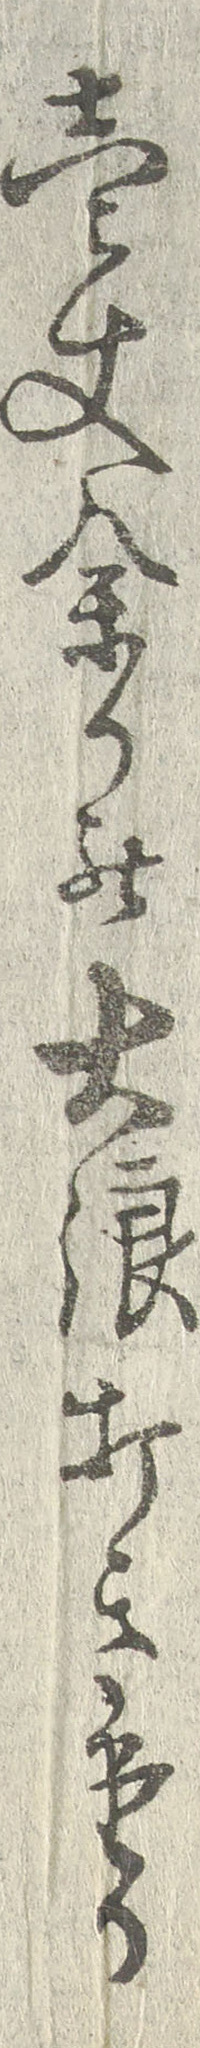壱丈余りの大浪打きたり
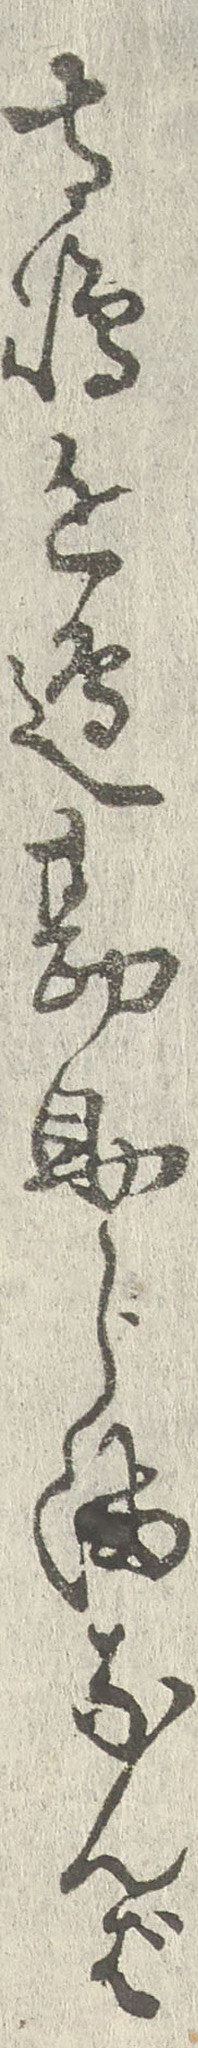寺島近辺勘助しまなんば
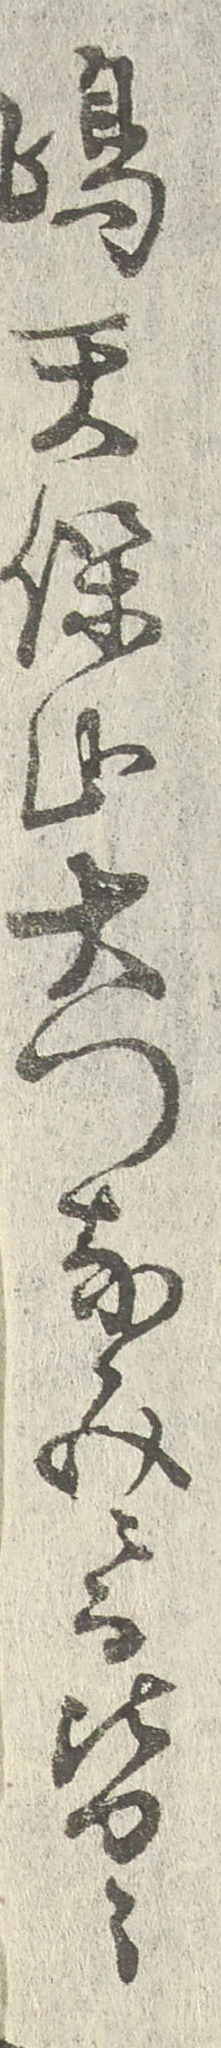嶋天保山大つなみにて皆々
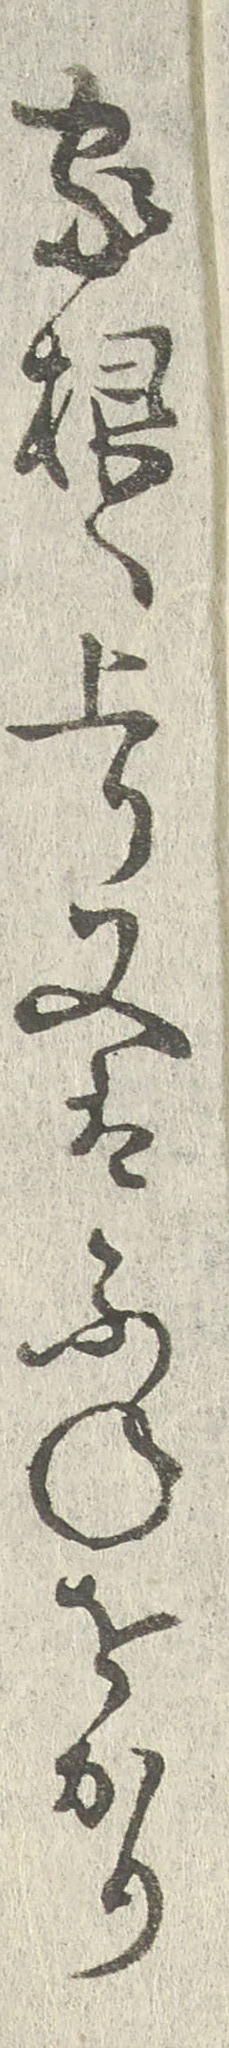家根へ上り又はふねをかり
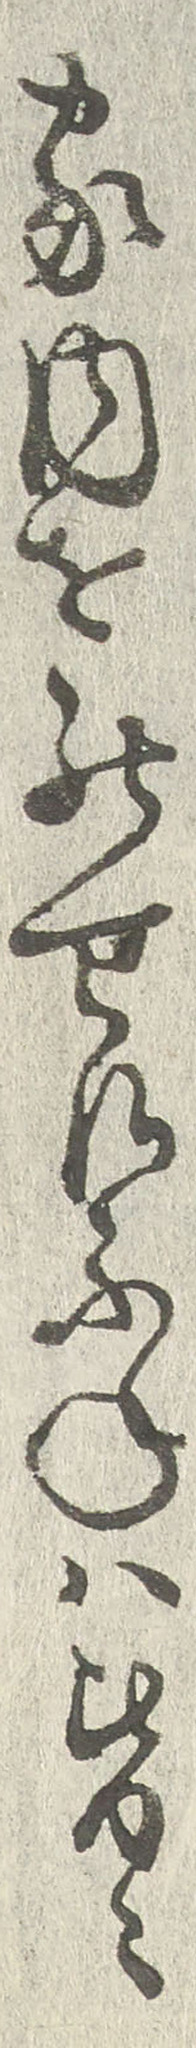家内をのせ候ふねは皆々
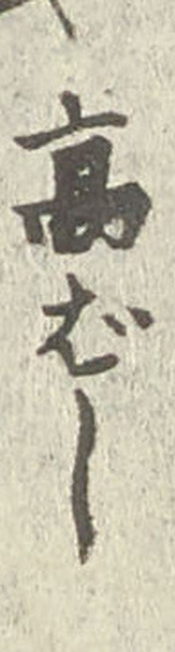高ばし
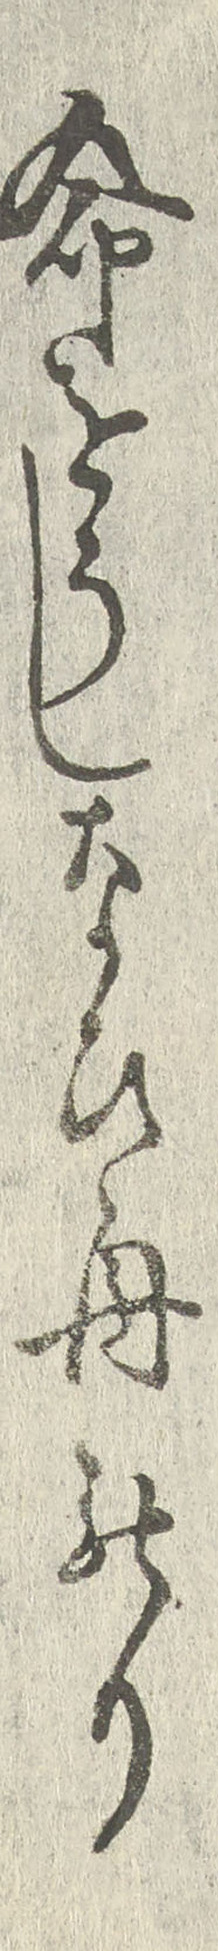命をうしなひ舟のり
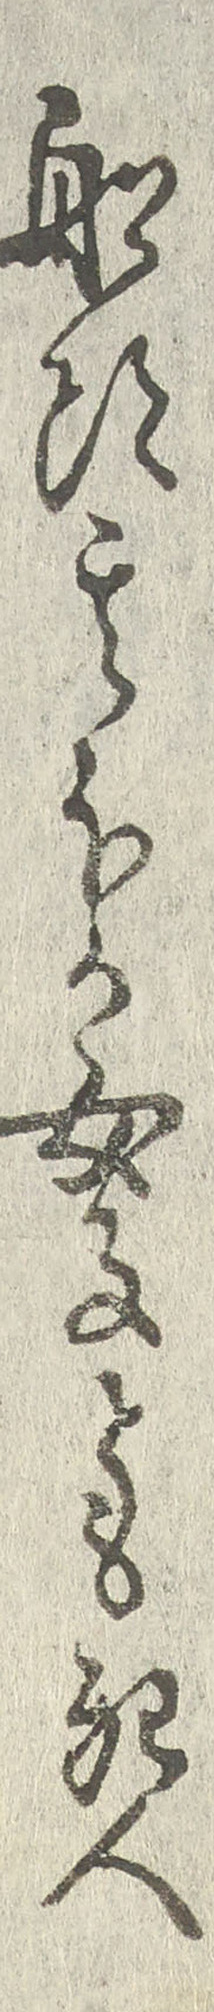船頭其ほか女子とも死人
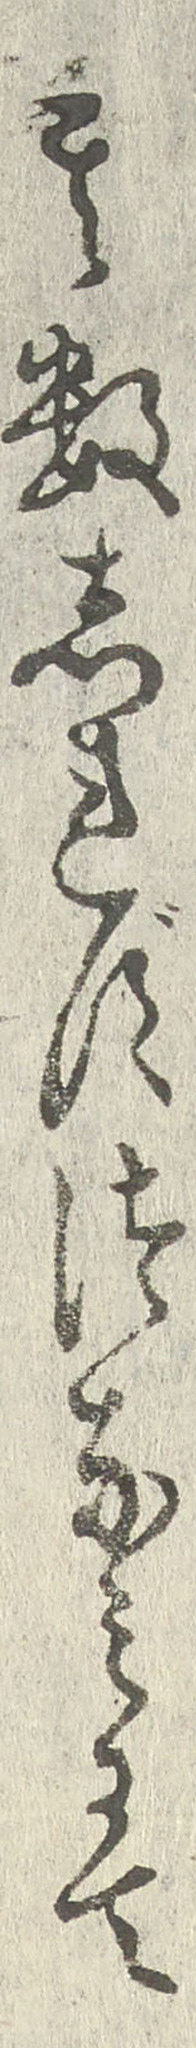其数しれずつなみにて
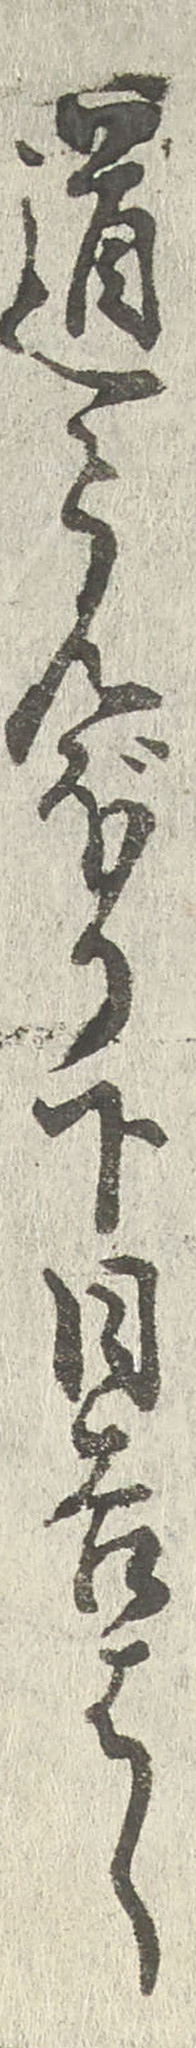道とんぼり下日吉はし
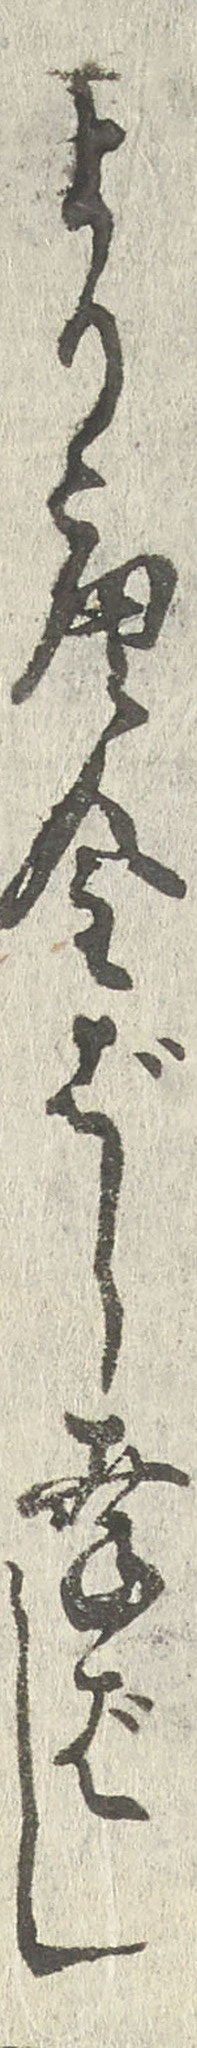より唐金ばし幸ばし
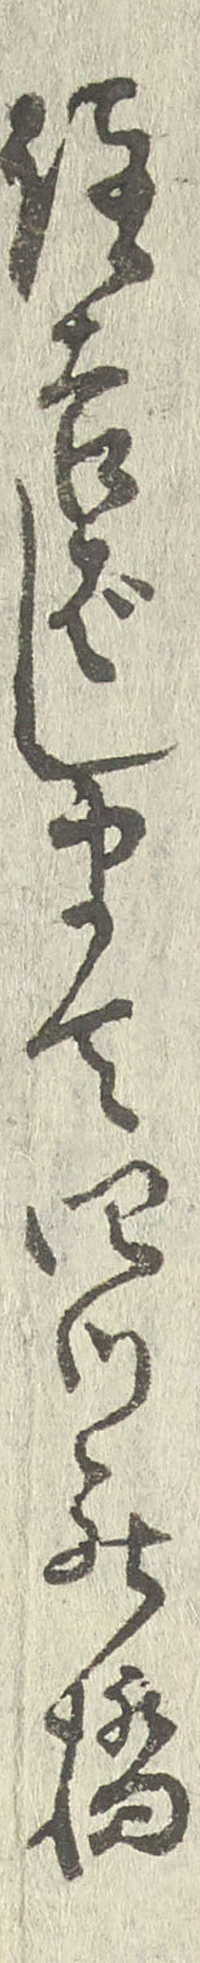住吉ばしまて四つの橋
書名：摂津大津波次第
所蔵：東京大学総合図書館 General Library in the University of Tokyo, JAPAN
